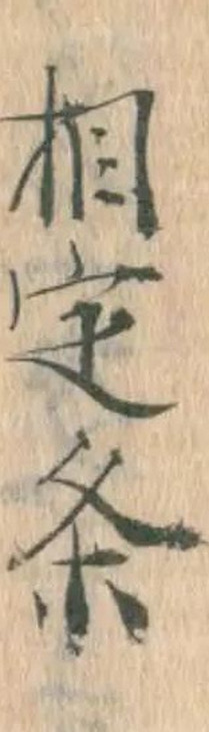相定条
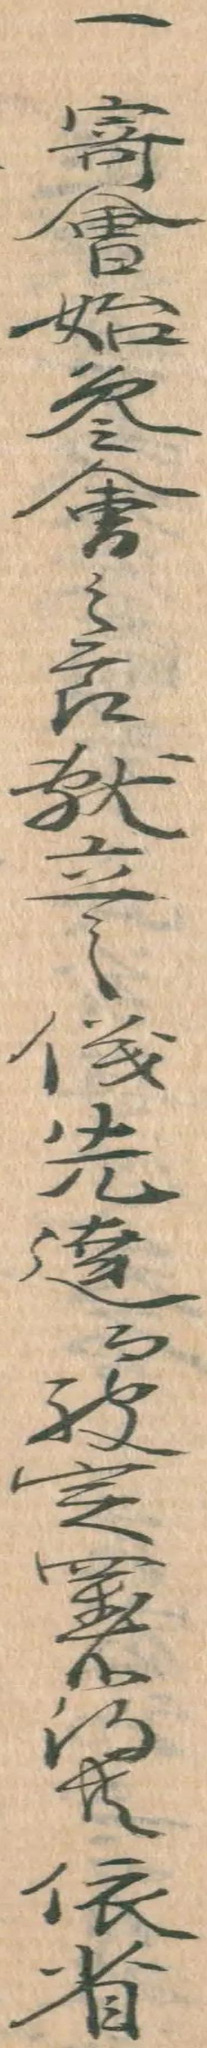一寄會始参会之節献立之儀先達而致定置候得共依省
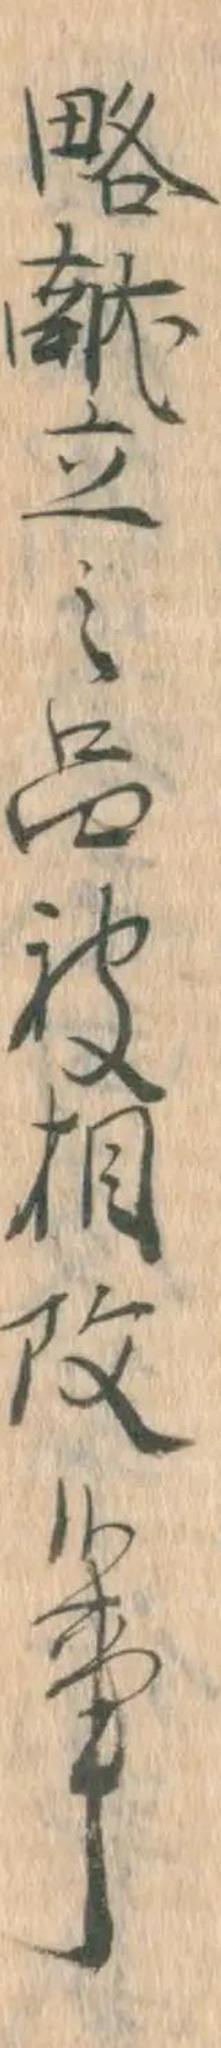略献立之品被相改候事
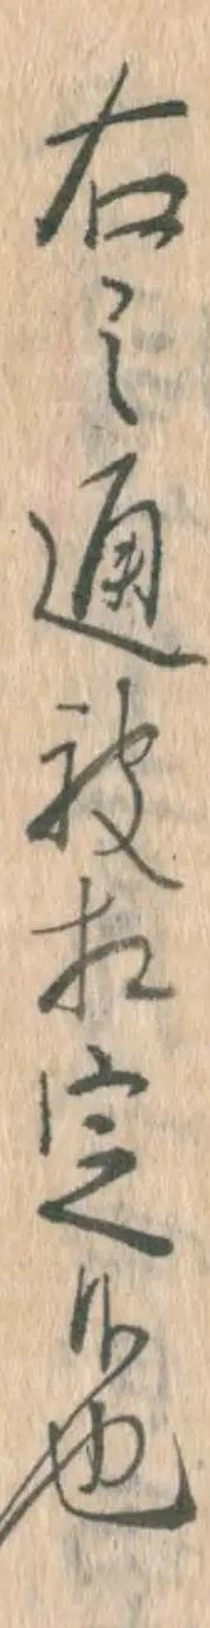右之通被相定候也
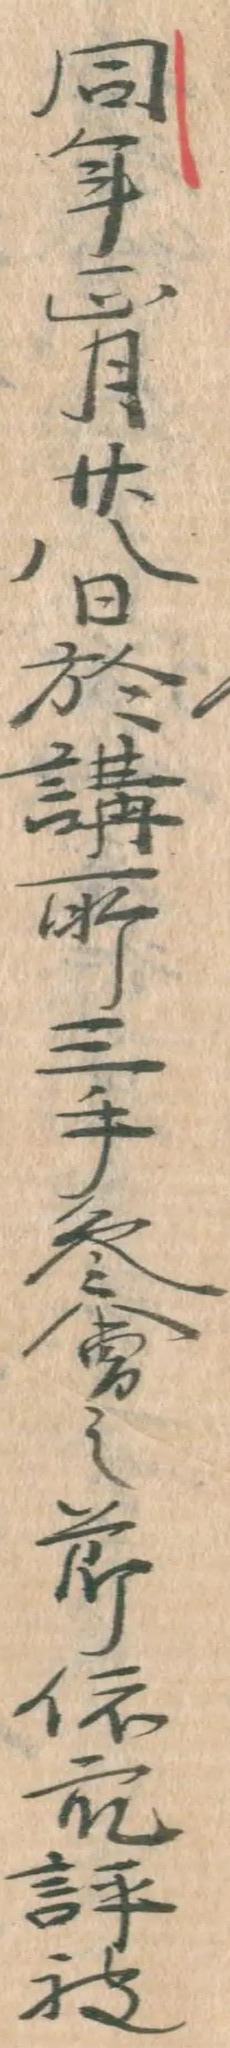同年正月廿八日於講所三手参會之節依衆評被
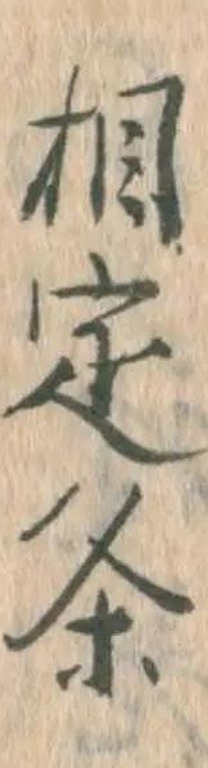相定条
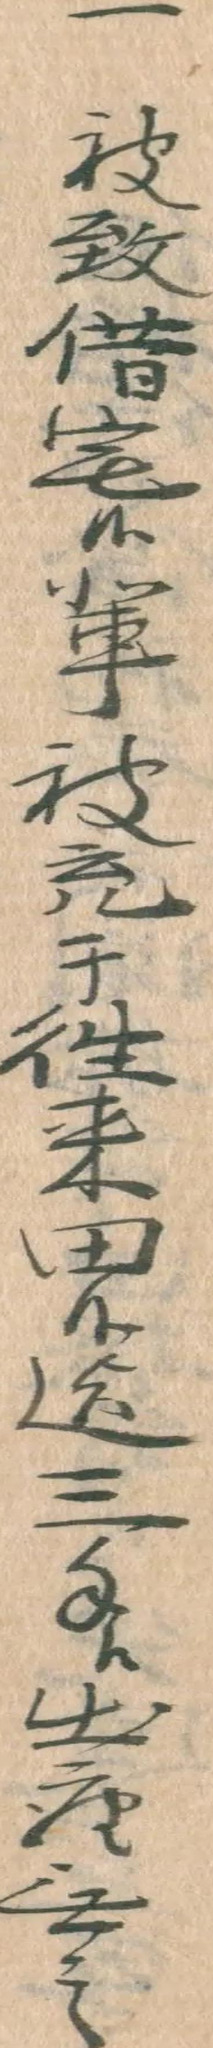一被致借宅候輩被充于往来田候迄三手え出座無之
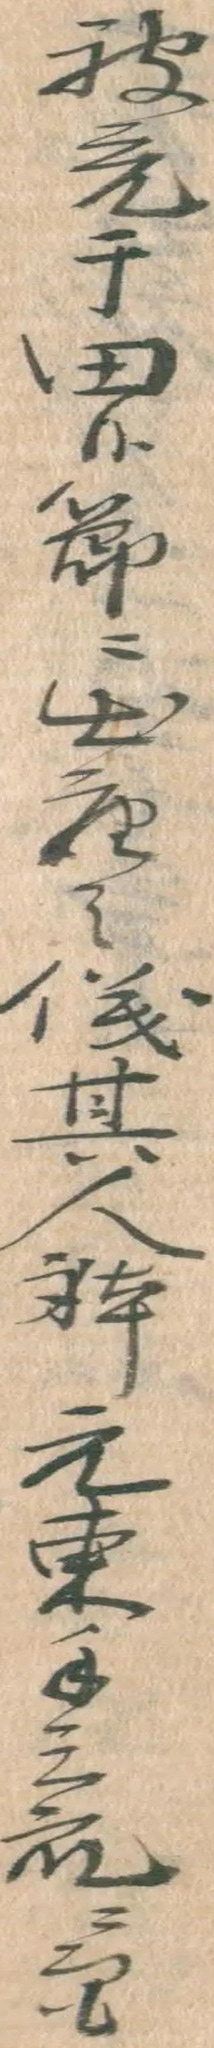被充于田候節ニ出座之儀其人躰元東手之衆ニ而も
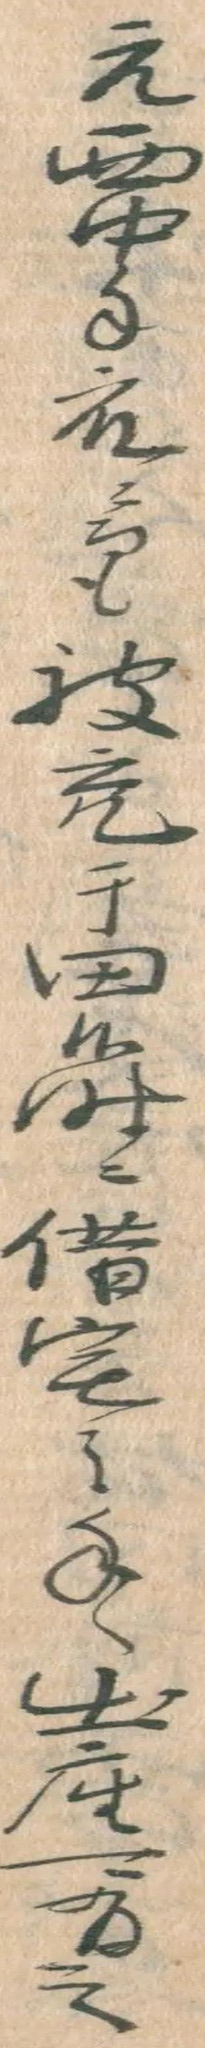元西中手衆ニ而も被充于田候時に借宅之手へ出座可有之
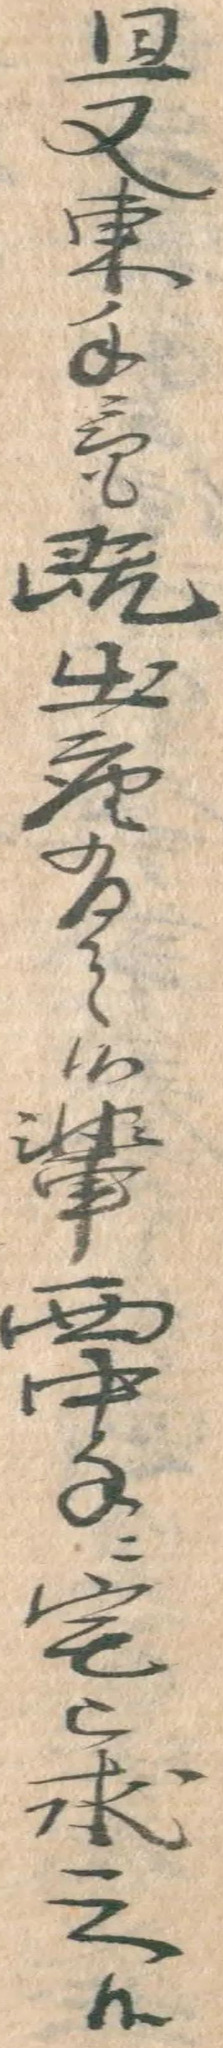且又東手ニ而も既出唐有之候輩西中手ニ宅被求之候
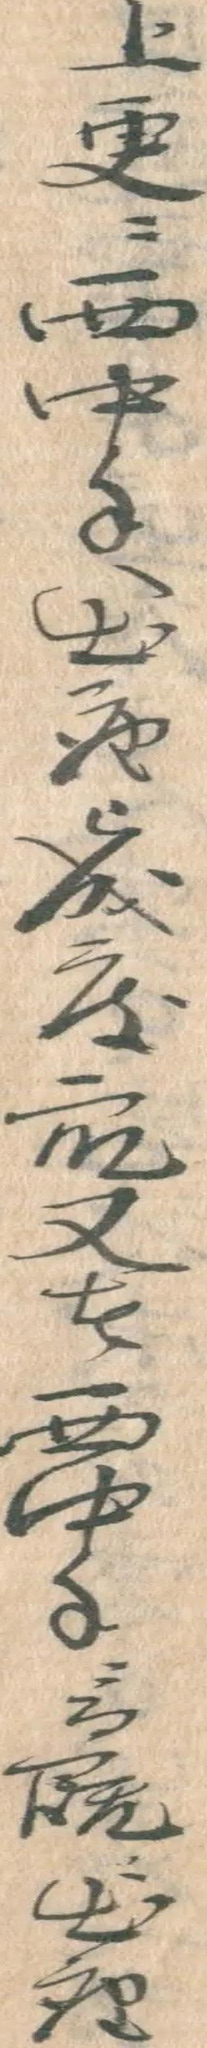上更二西中手へ出座被成度衆又は西中手ニ而既ニ出座
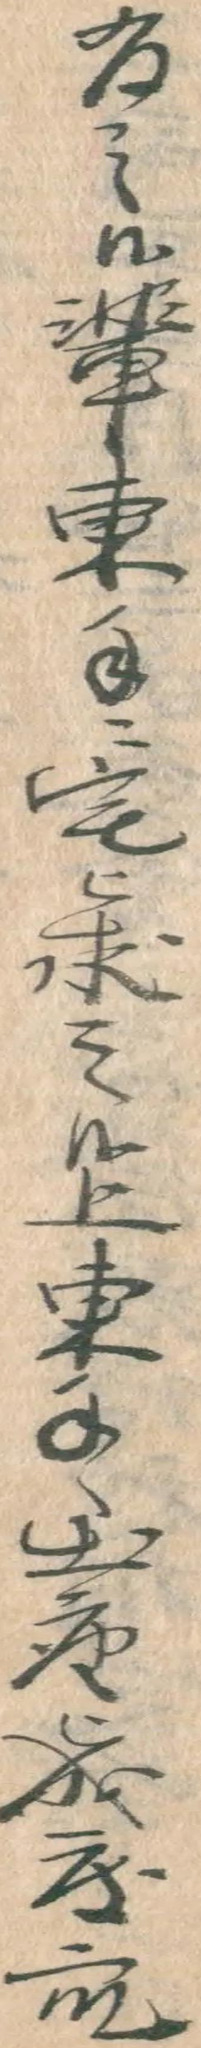有之候輩東手ニ宅被求之候上東手へ出座被成度衆
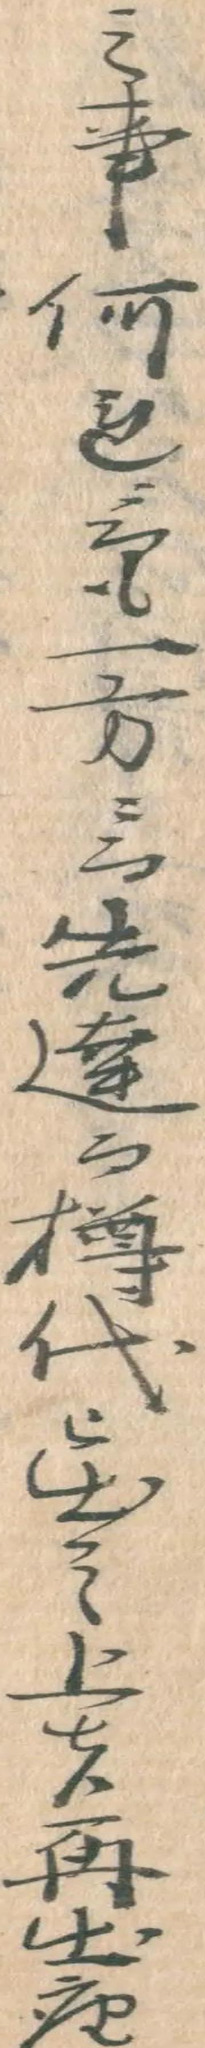之事何れニ而も一方ニ而先達而樽代被出之上は再出座
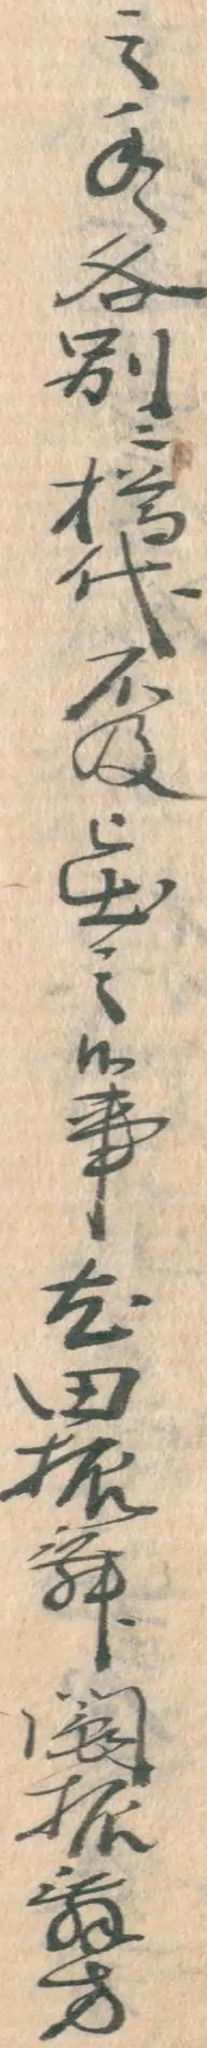之手へ各別ニ樽代不及被出之候事尤田振舞鬮振舞方

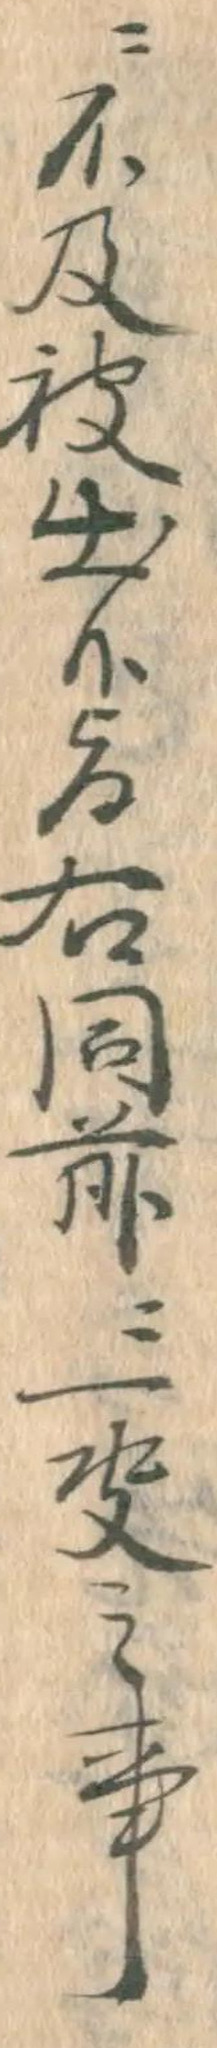ニ不及被出候旨右同前ニ一決之事
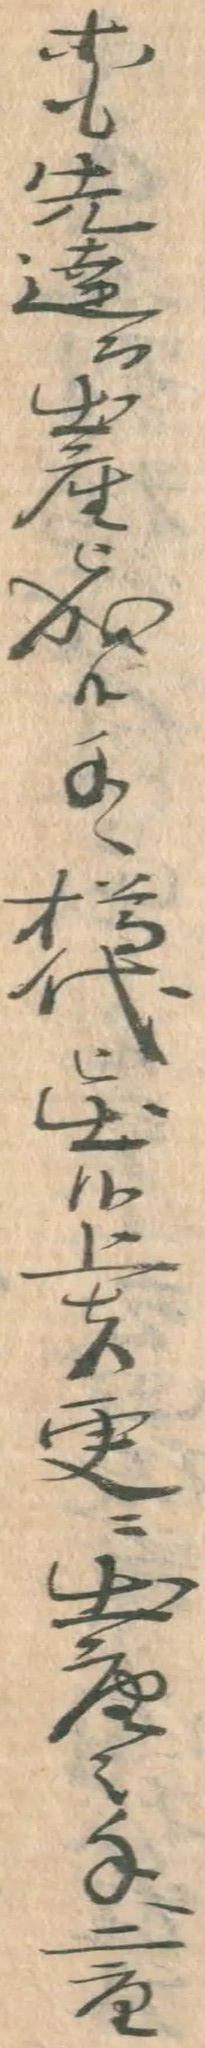等も先達而出座被成候手へ樽代被出候上は更ニ出座之手ヘ二重
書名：賀茂社記録. 第29冊
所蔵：国立国会図書館 National Diet Library, JAPAN
